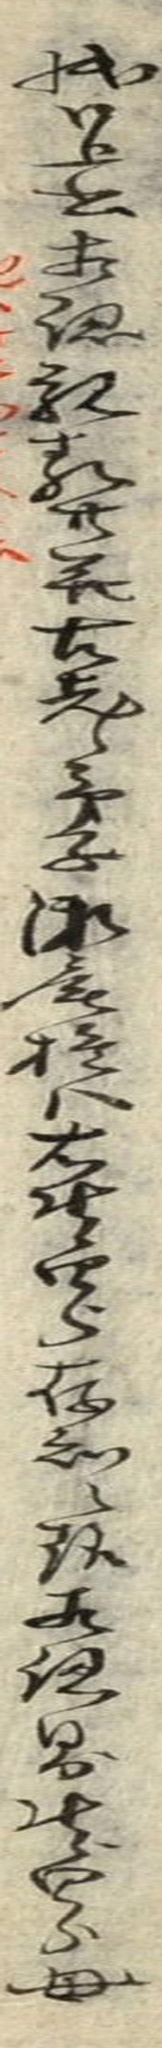紙口上書相認親類共并古老之弟子瀬尾権八右次郎四郎存知之趣相認則次郎四郎母
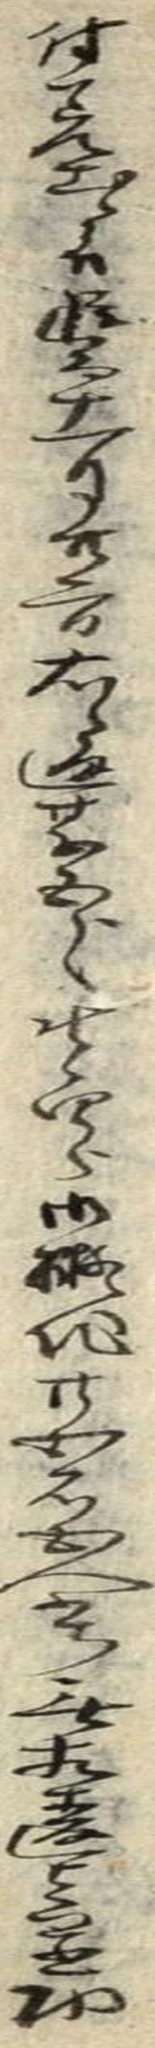付差候に付追而十一月廿二日右之通甚五郎次郎四郎御擬作廿五石五人ふち無相違被下置功
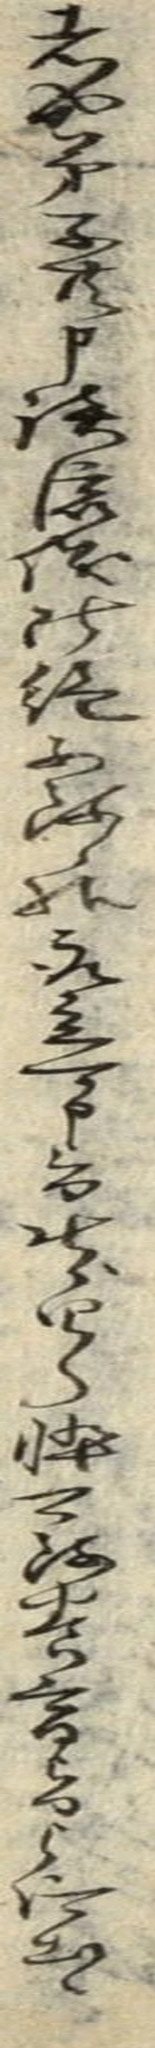者成弟子共申談流儀断絶不致候様取立可申旨次郎四郎悴可致養育旨被仰出候
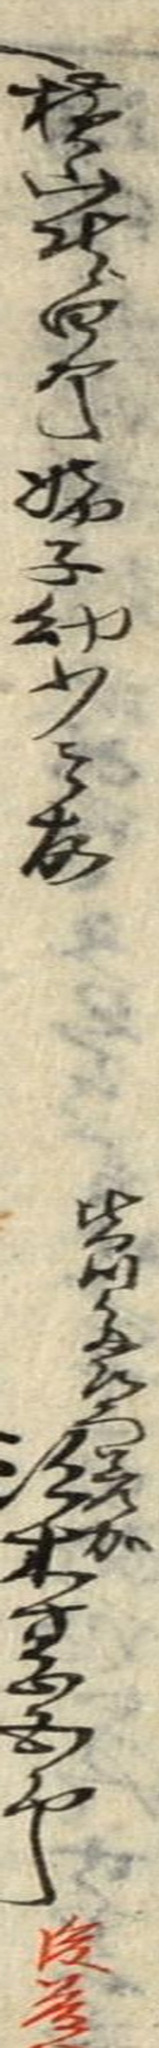横山次郎四郎嫡子幼少に候故皆川多左衛門差加

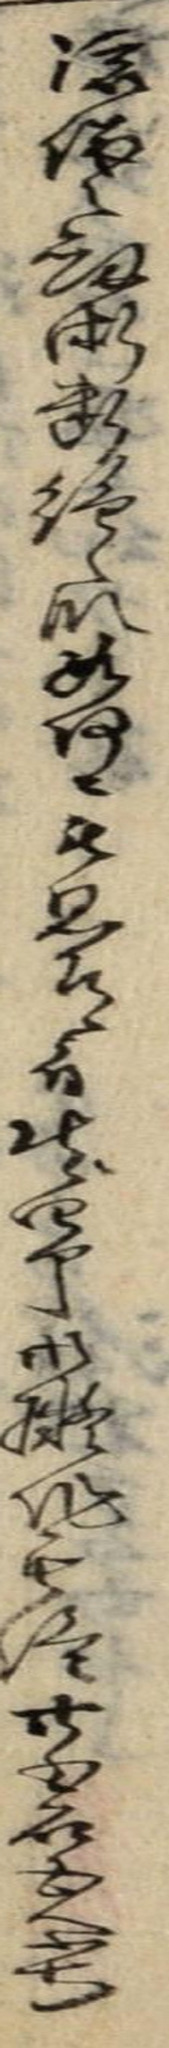流儀之劔術断絶候段如何に被思召候に付次郎四郎御擬作其儘廿五石五人ふち
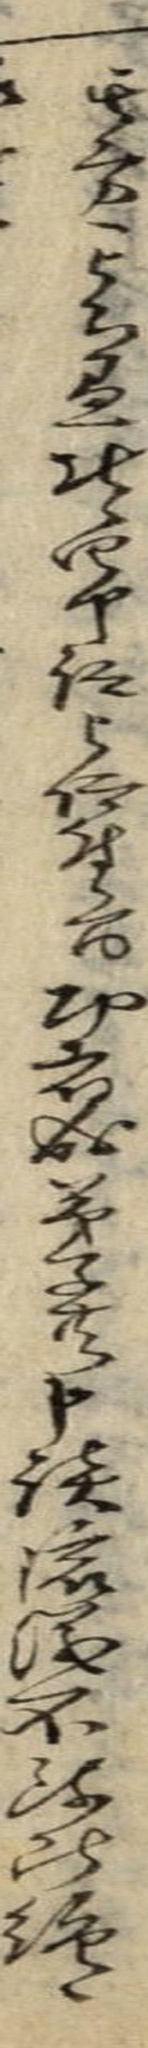其方へ被下置次郎四郎跡被仰付候間功者成弟子共申談流儀不致断絶候
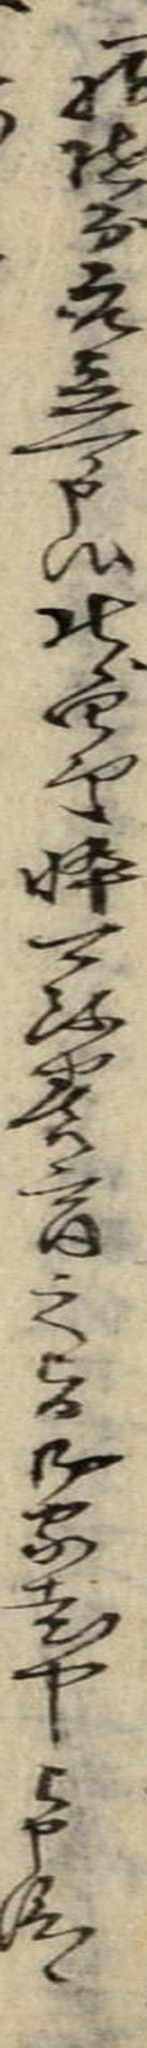様随分取立可申候次郎四郎悴可致養育之旨御家老中被申渡候
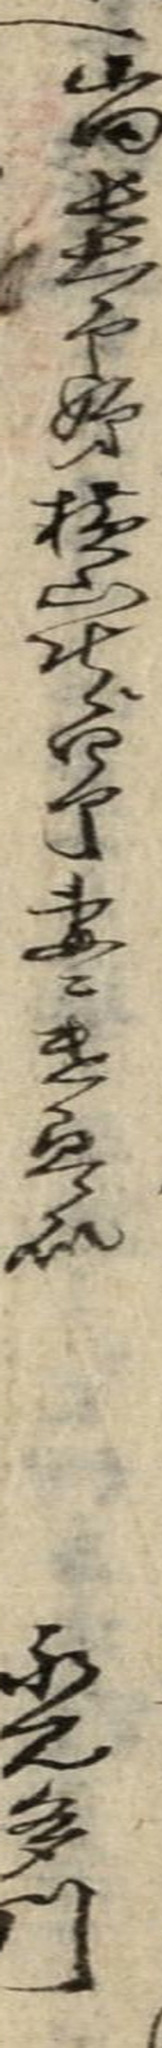一山田長太郎姉横山次郎四郎妻に遣置候処永見多門
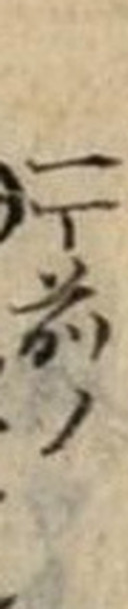一丁前ノ
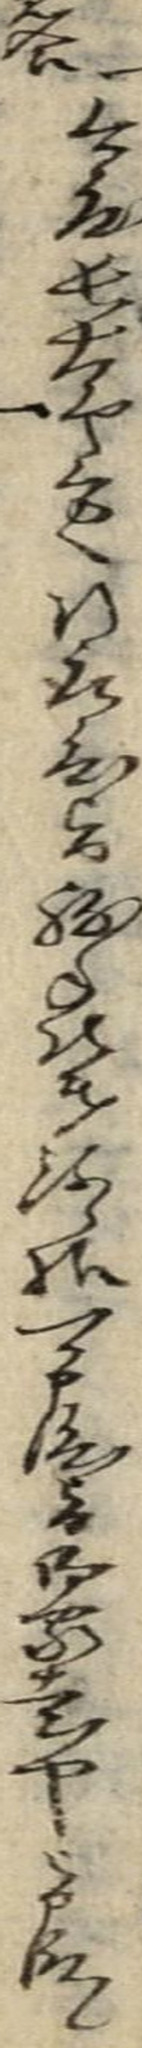今度長太郎方へ引取度旨勝手次第致候様可申渡旨御家老中被申渡候
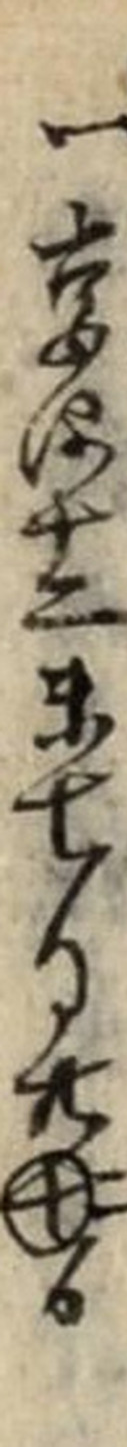一享保十二年七月廿七日
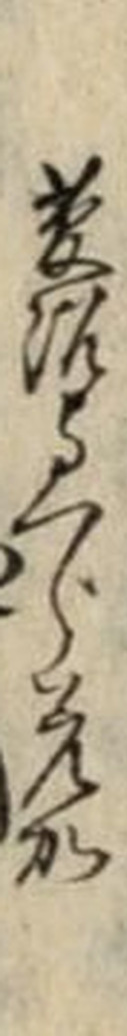菅沼与一郎差加
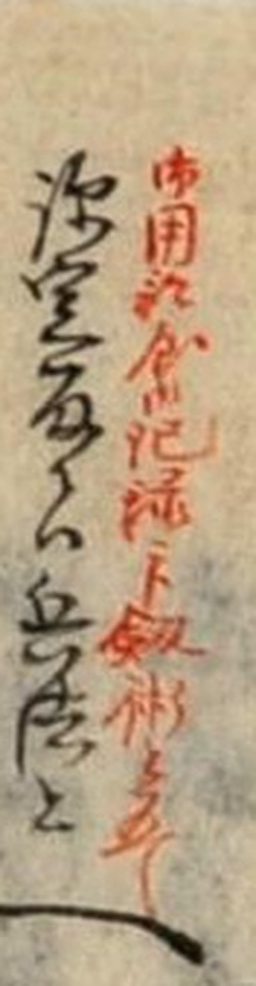評定留には兵法と
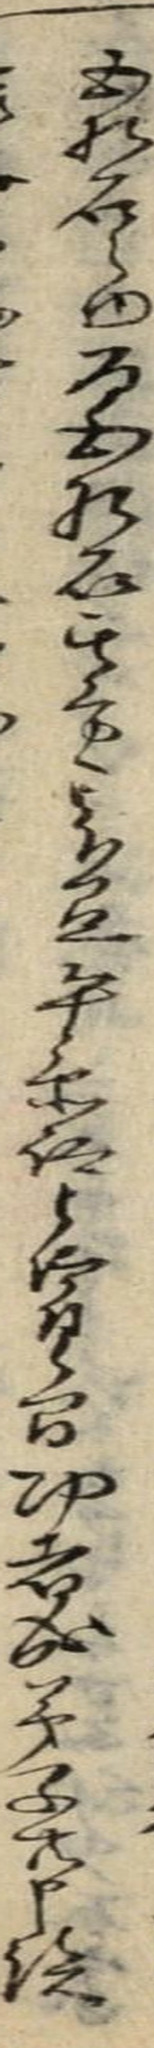五拾石之内百五拾石其方へ被下置平兵衛跡被仰付候間功者成弟子共申談
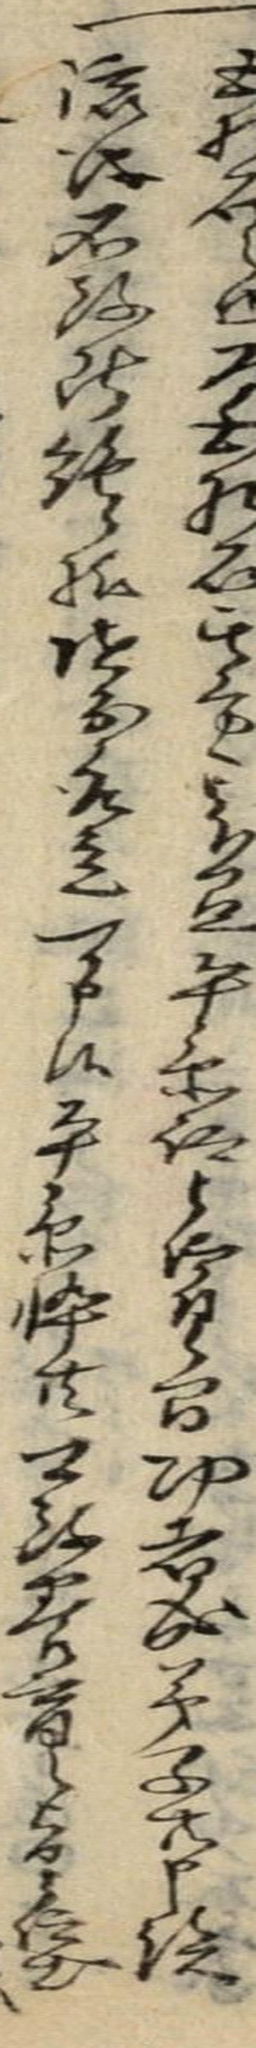流儀不致断絶候様随分取立可申候平兵衛悴共可致養育候旨被仰出之
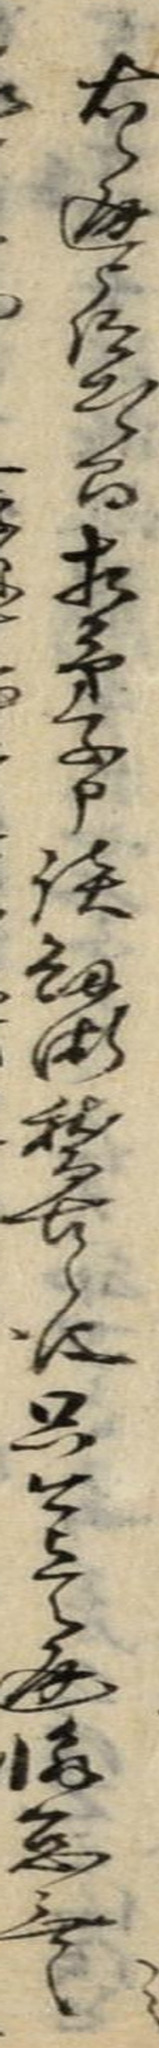右之通被仰出候間相弟子申談劔術稽古之儀只今迄之通懈怠無之
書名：養子縁組之部
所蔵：福井県文書館 Fukui Prefectural Archives
